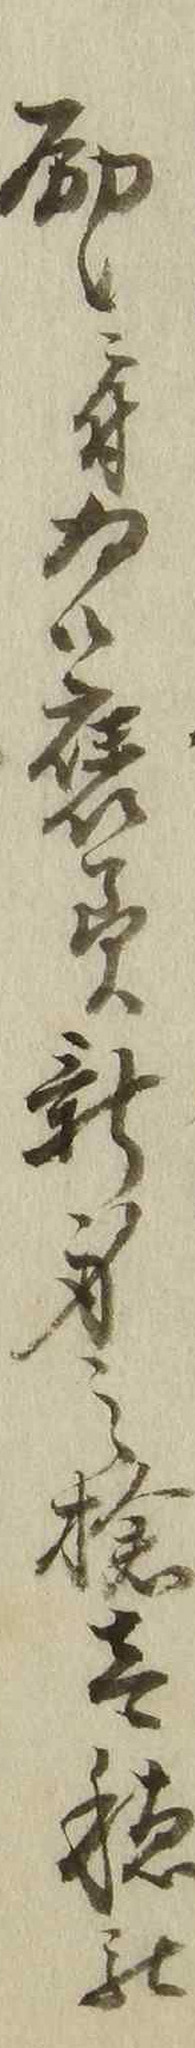励候ニ付為御褒美新身之槍壱穂被
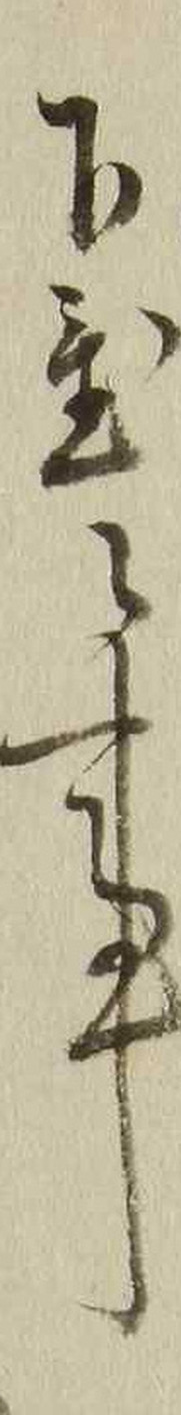下置候事
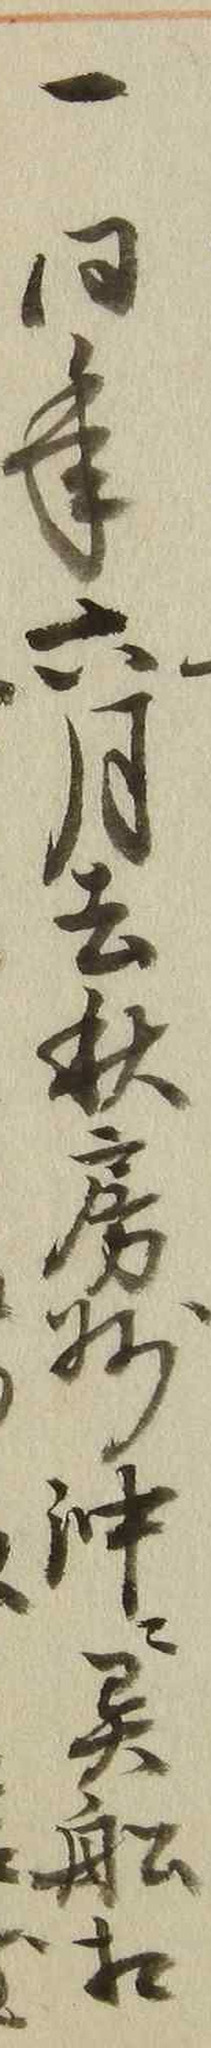一同年六月去秋房州沖ニ異船相
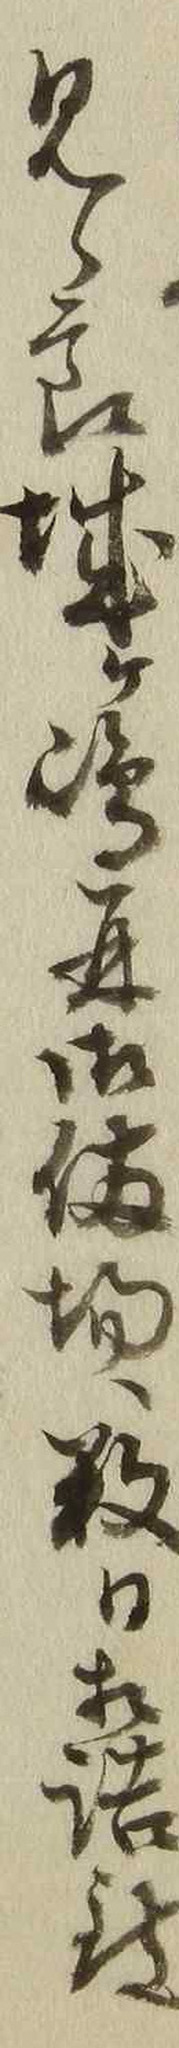見候節城ヶ崎再御備場へ数日相詰致
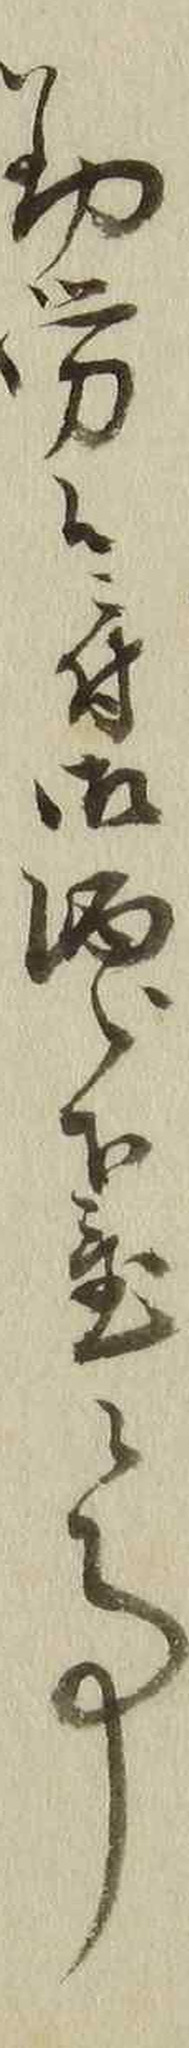勤労候ニ付御酒被下置候事
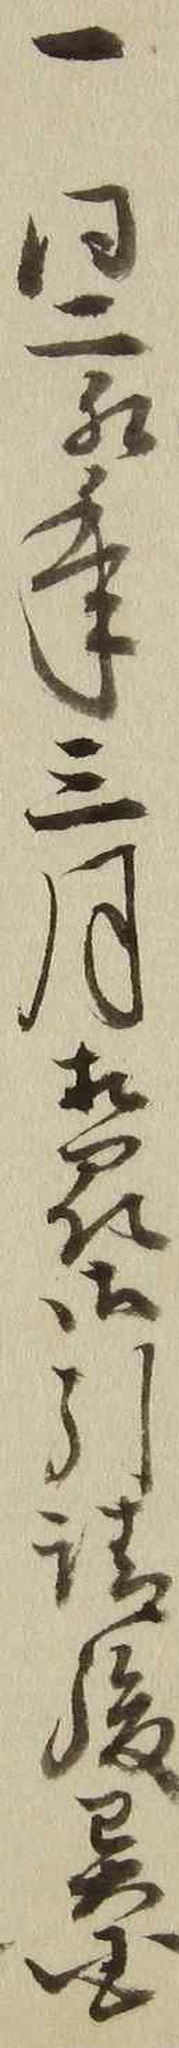一同二卯年三月相州御引請後異国
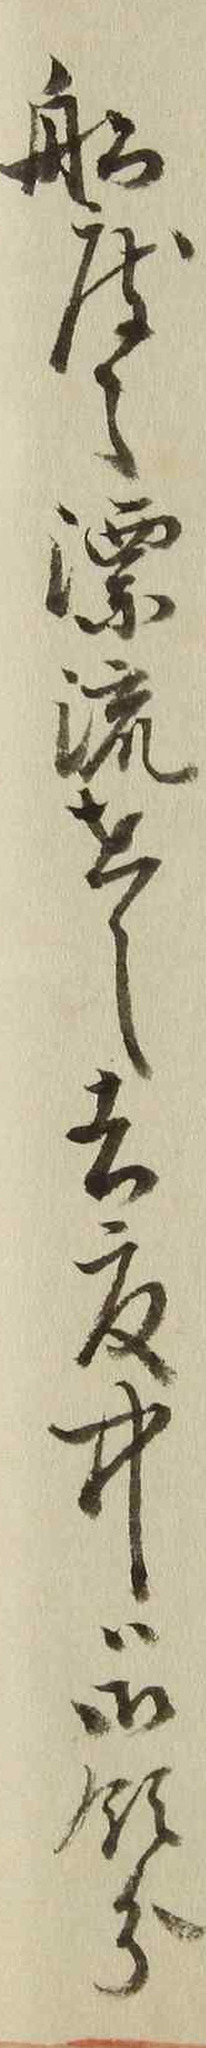船度々漂流をし去夏中ハ御領分
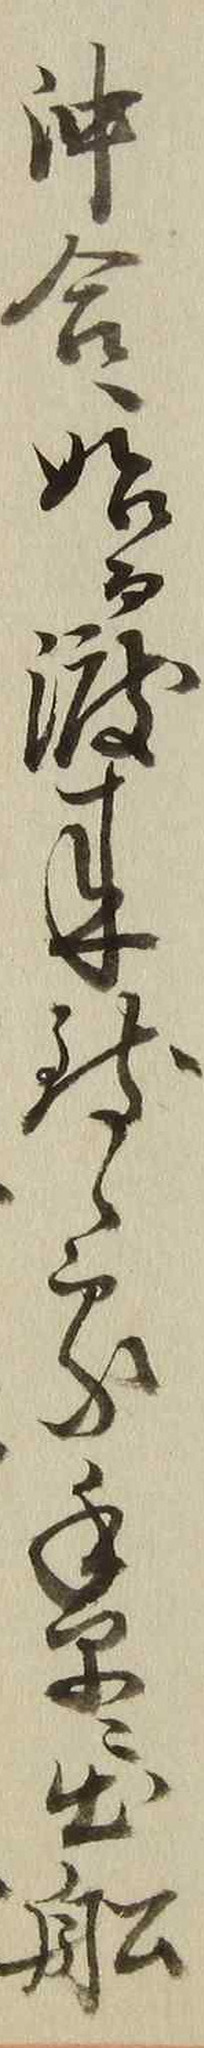沖合へ始而渡来致候処手早ニ出船
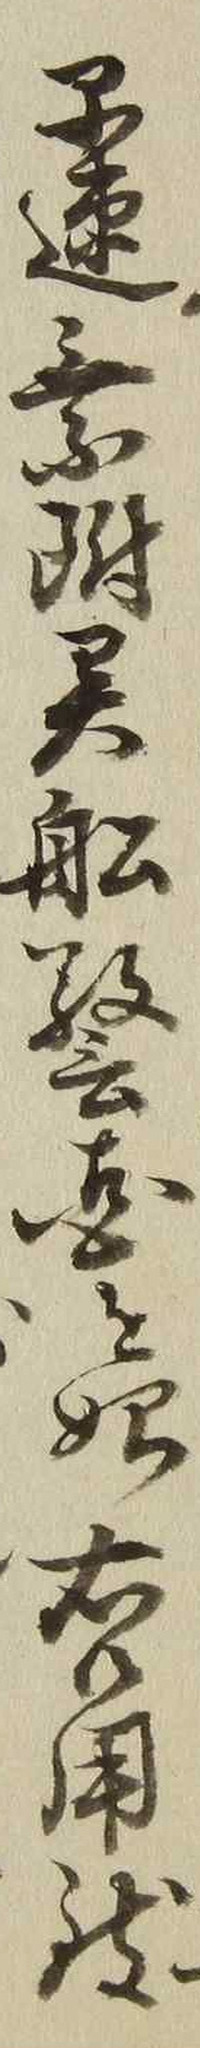早速乗附異船警固を始右御用致
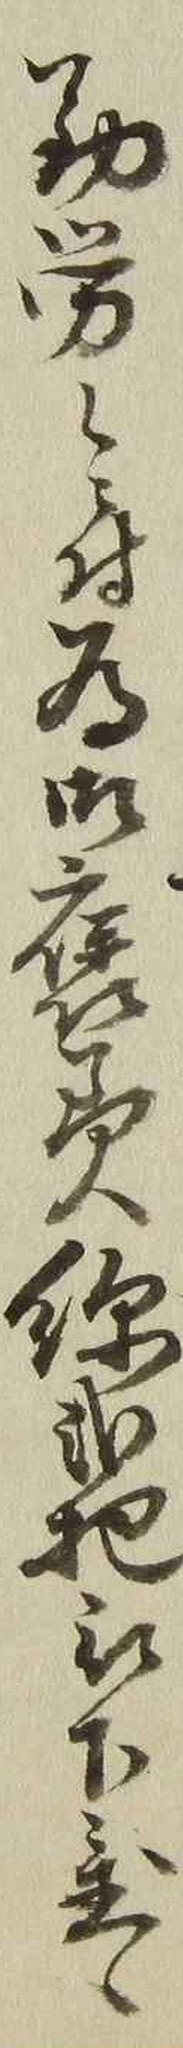勤労候ニ付為御褒美綿弐把被下置候
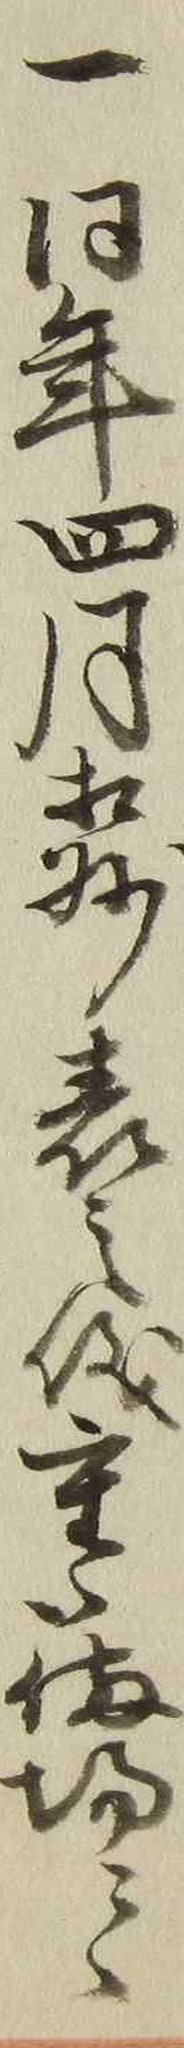一同年四月相州表之儀重御備場ニ候
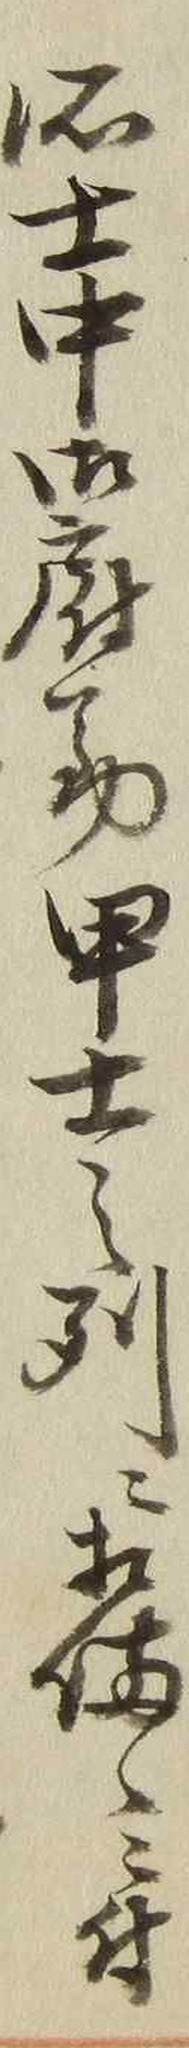所士中御雇勤甲士之列ニ相備候ニ付
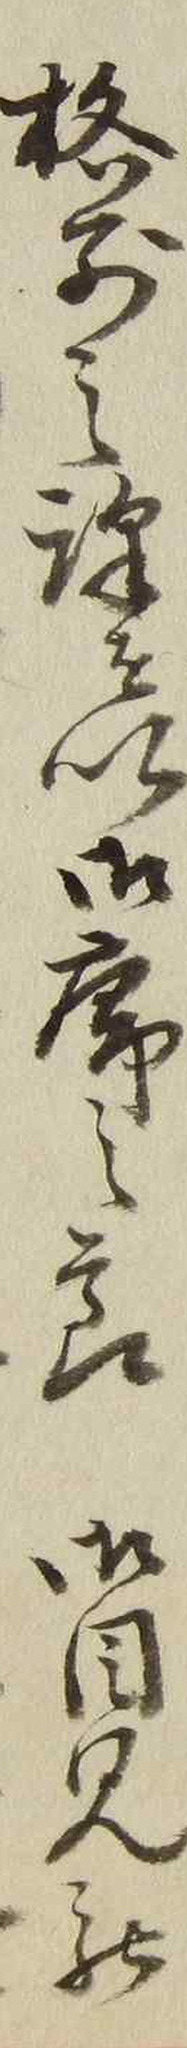格別之訳を以御序之節御目見被
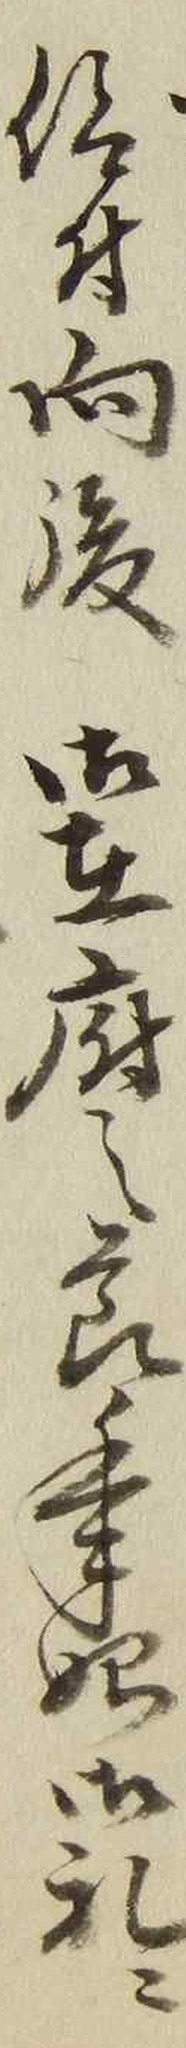仰付向後御在府之節年始御礼ニ
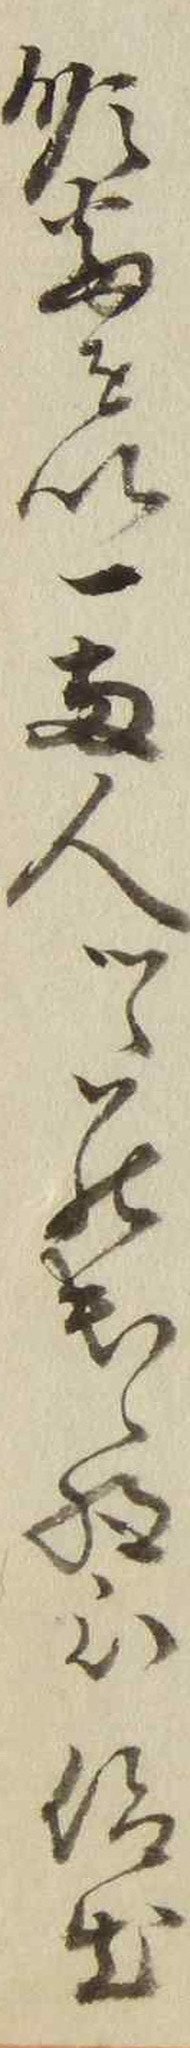順番を以一両人ツヽ罷出候様被仰出

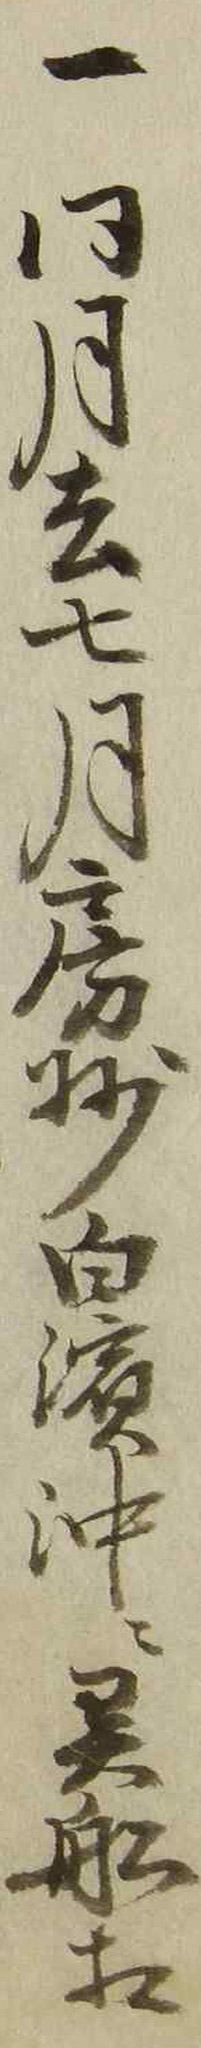一同月去七月房州白浜沖ニ異船相
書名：諸士系譜　巻之53　に之部4
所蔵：会津若松市立会津図書館
